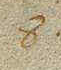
8
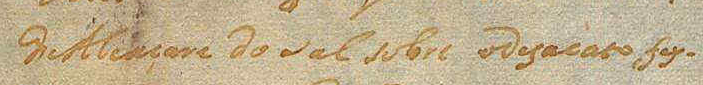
de Alcacere do sal sobre o desacato fey
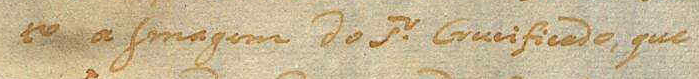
to a Jmagem do S.or Crucificado, que
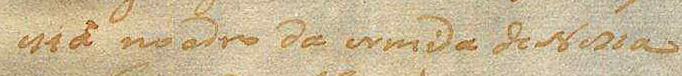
está no adro da ermida de Nossa
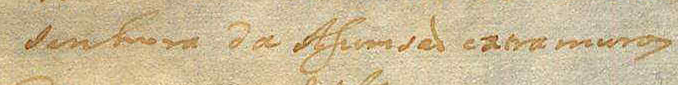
senhora da Asumsaõ extramuros
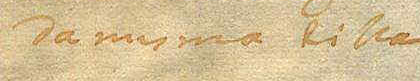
da mesma villa
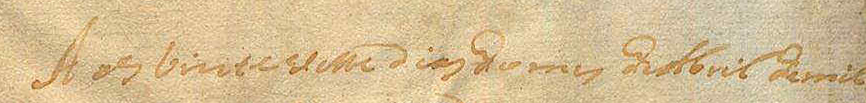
Aos vinte e sette dias do mes de Abril de mil
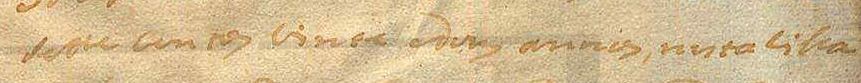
settecentos vinte e dous annos, nesta villa
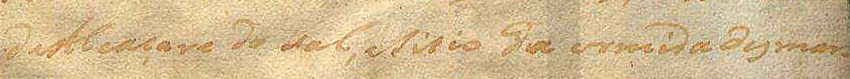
de Alcacere do sal, e sitio da ermida dos mar
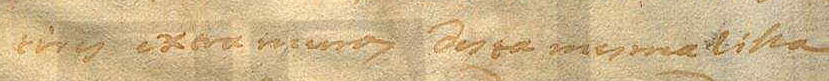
tires extramuros desta mesma villa
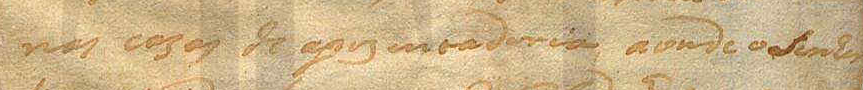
nas cazas de apozentadoria, aonde o Senhor
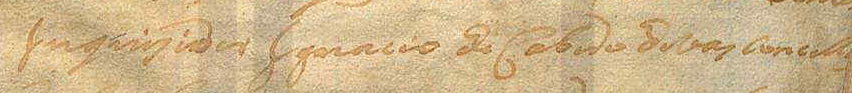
Jnquizidor Jgnacio de Cabedo de vasconcellos
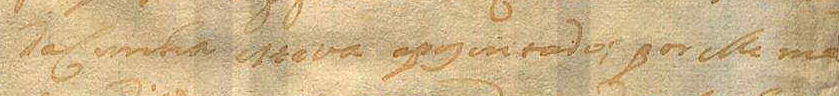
da Cunha estava apozentado, por elle me
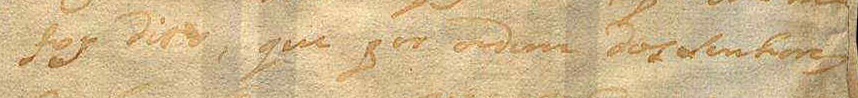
foy dito, que por ordem dos senhores
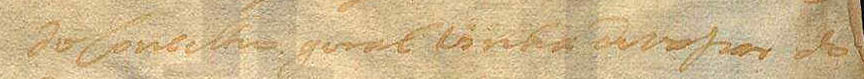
do Conselho geral vinha devassar do
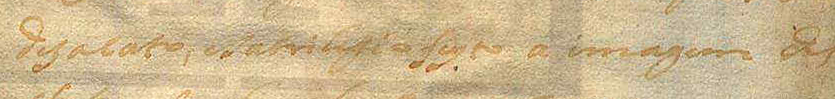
desacato, e sacrilegio a imagem de
